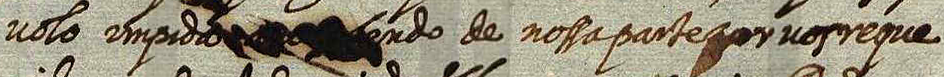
uo lo impida _ sendo de nossa parte por uos reque
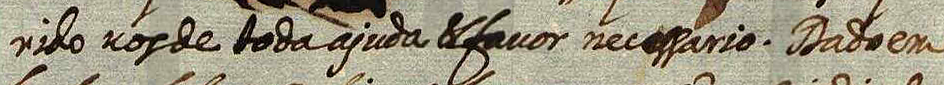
rido uos de toda ajuda & fauor necessario. Dado em
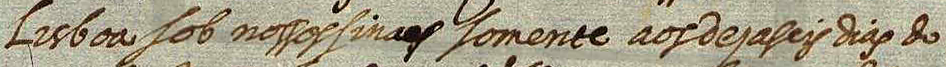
Lisboa sob nossos sinaes somente aos dezaseis dias do
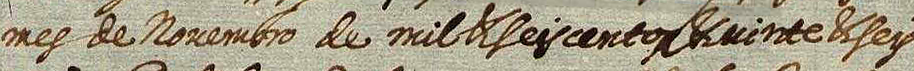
mes de Nouembro de mil & seiscentos & uinte & seis
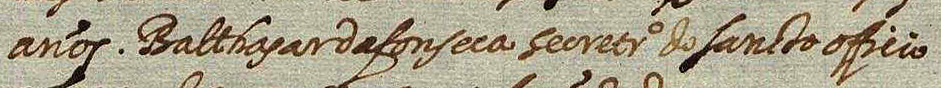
anōs. Balthasar da fonseca secretro do sancto officio
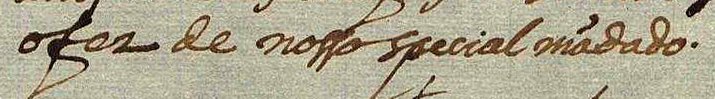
o fez de nosso special mādado.
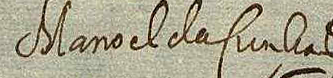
Manoel da Cunha
